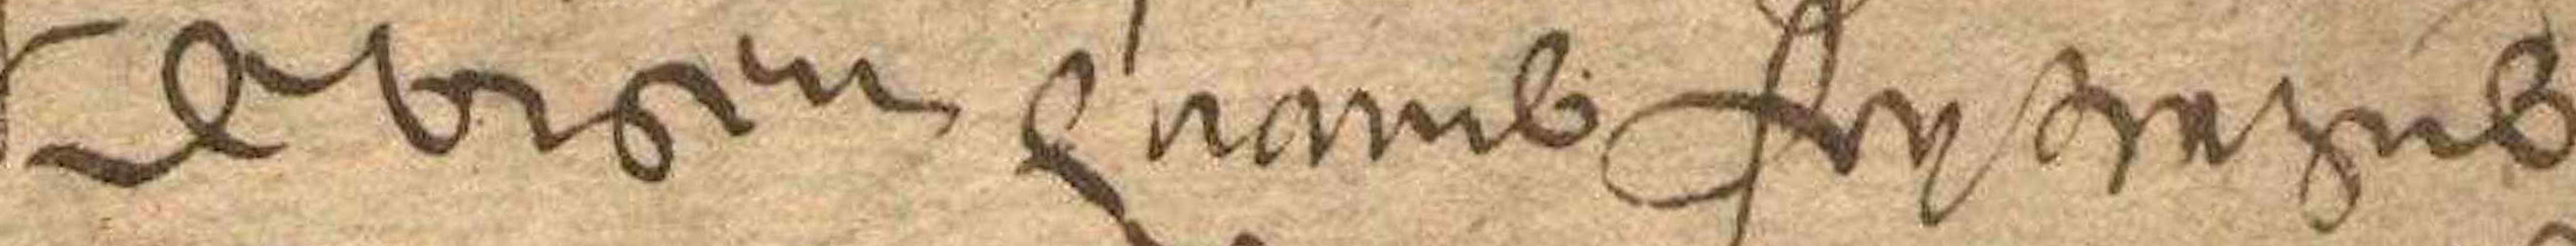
de viseu Quando foy trazido
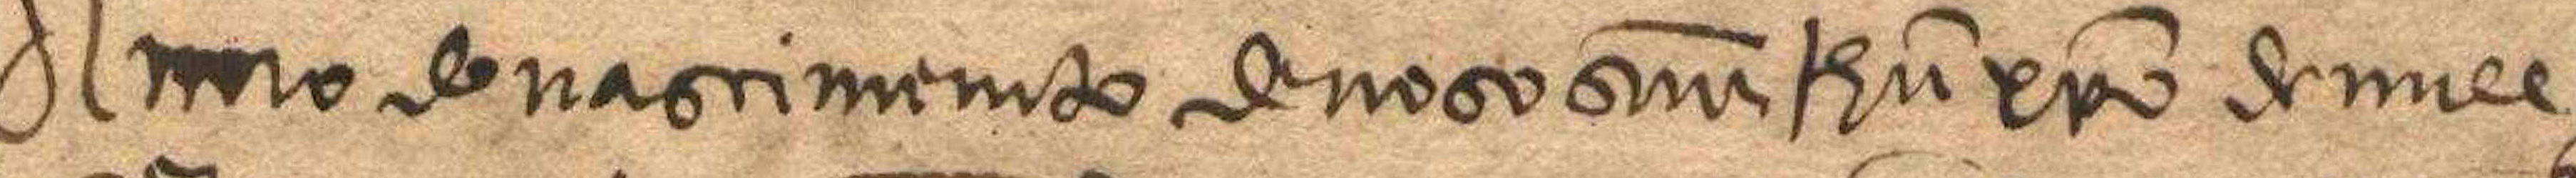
Anno do nascimemto de noso s̄nor Jhū xp̄o de mill
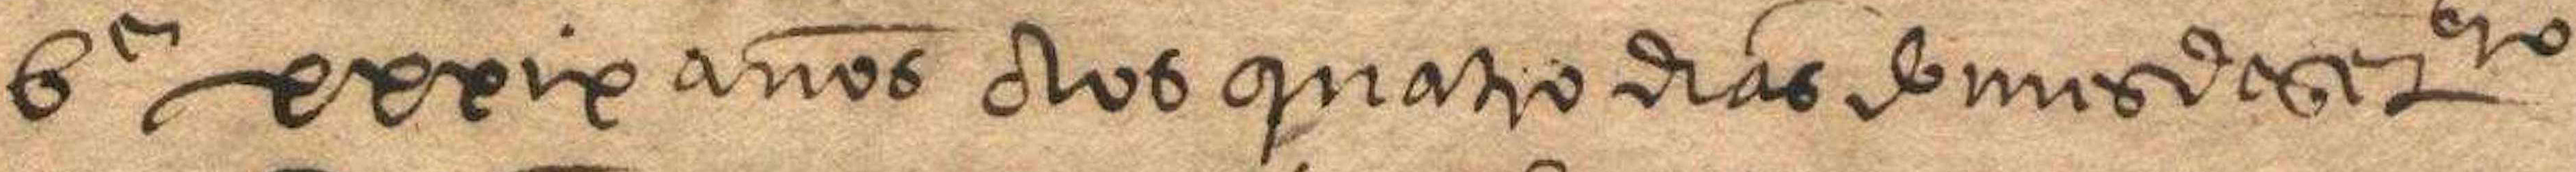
bc xxxix an̄os Aos quatro dias do mes de setbro
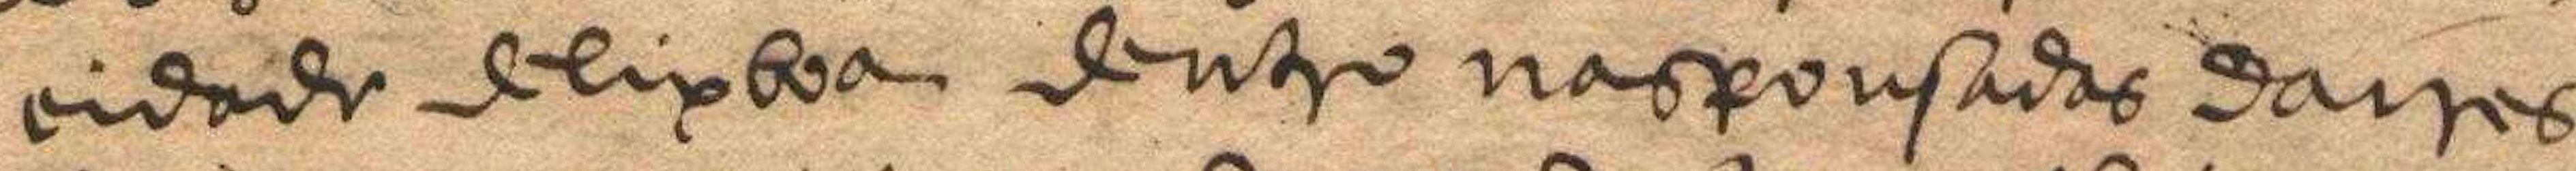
çidade de lixboa dentro nas pousadas daires
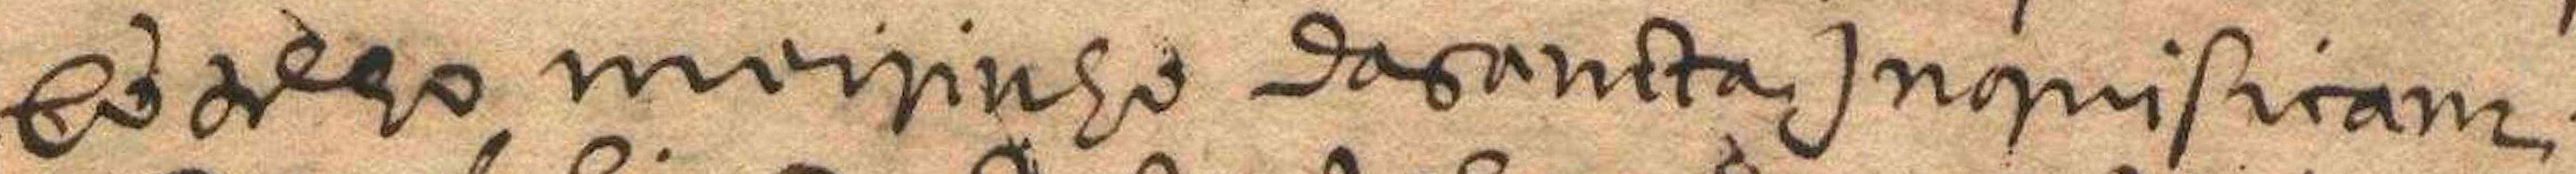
botelho meirinho da sancta Jnquisiçam.
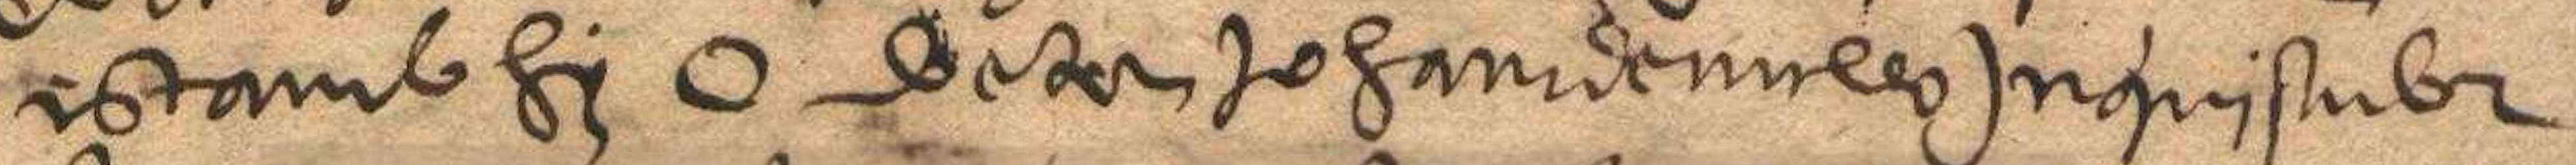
estando hy O doctor Joham de mello Jnqujsidor
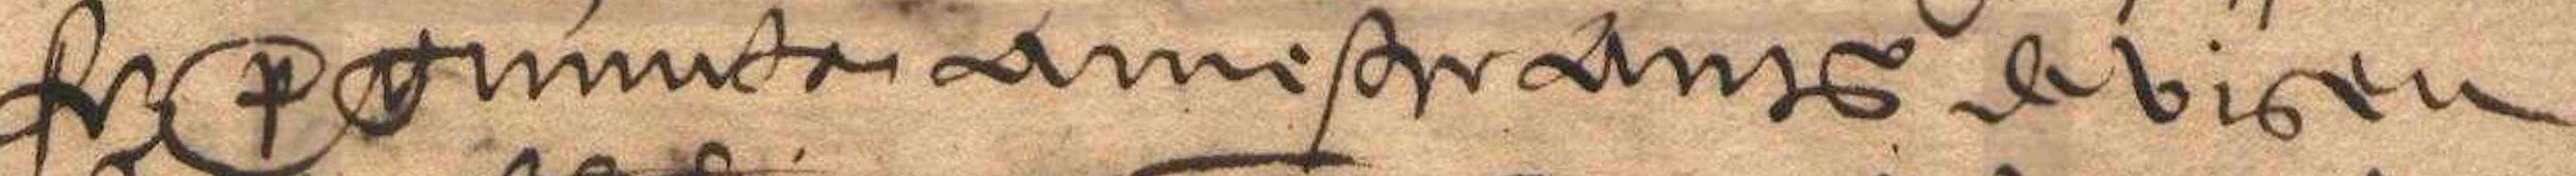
fez p̄gunnta a mestre anto de viseu
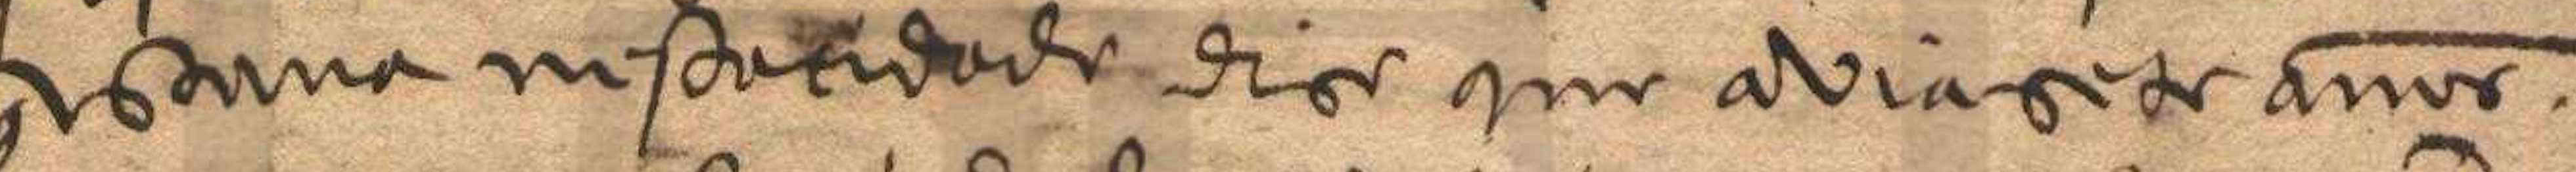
q̄ estaua nesta çidade dise que avia sete an̄os.
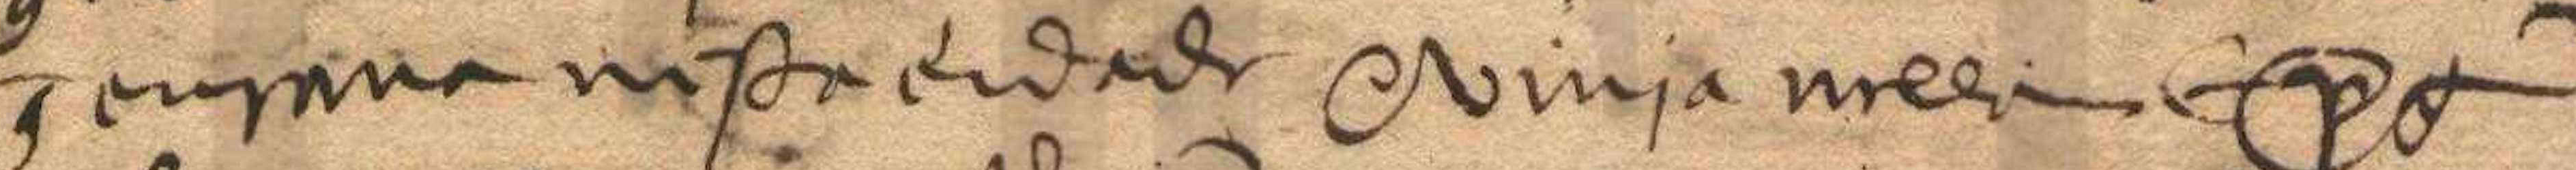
q̄ curaua nesta cidade e viuja nella E p̄gū
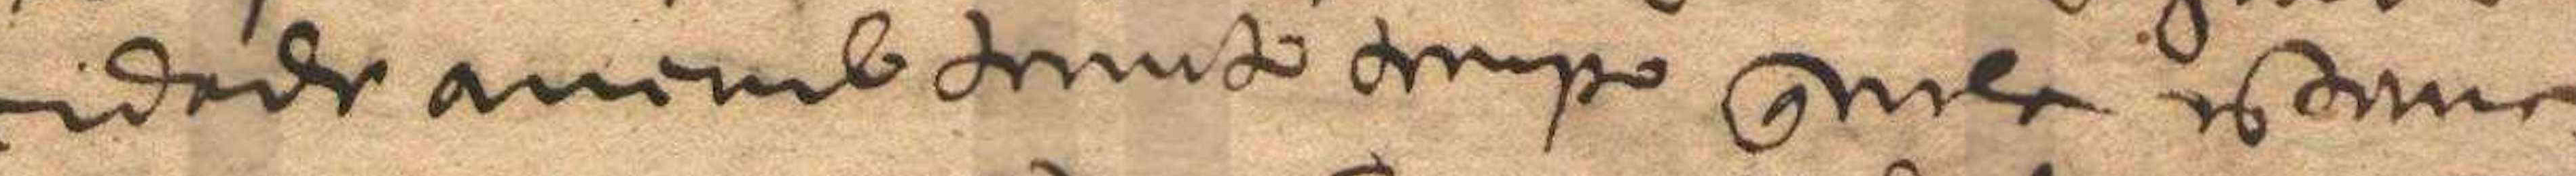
çidade auendo tamto tempo q̄ nela estaua
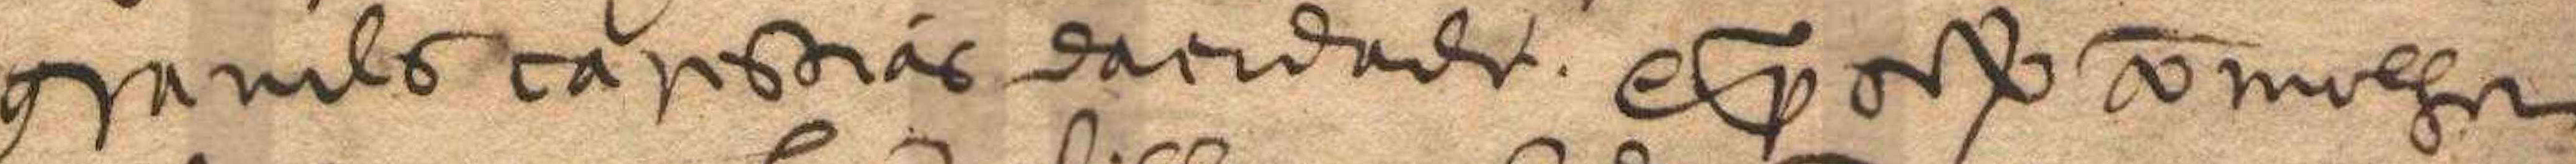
grandes carestias da cidade. e p̄o se ꝟ c̄o molher
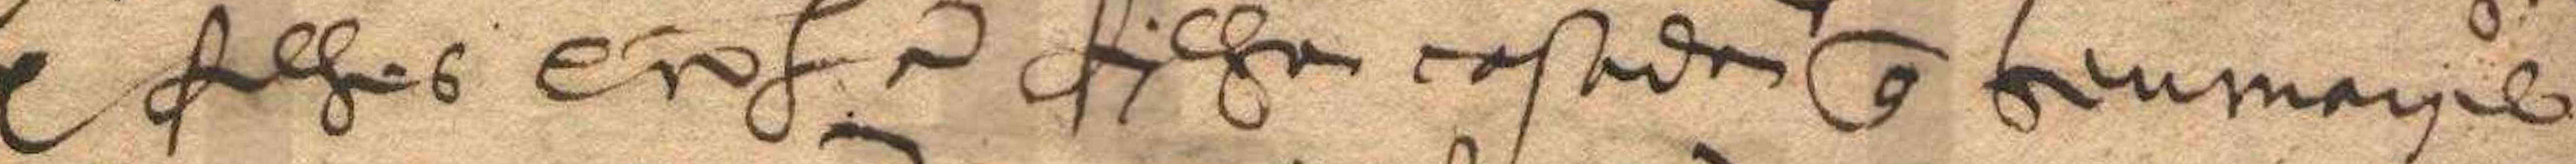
e filhos e c̄o huā fjlha casada q̄ seu marjdo
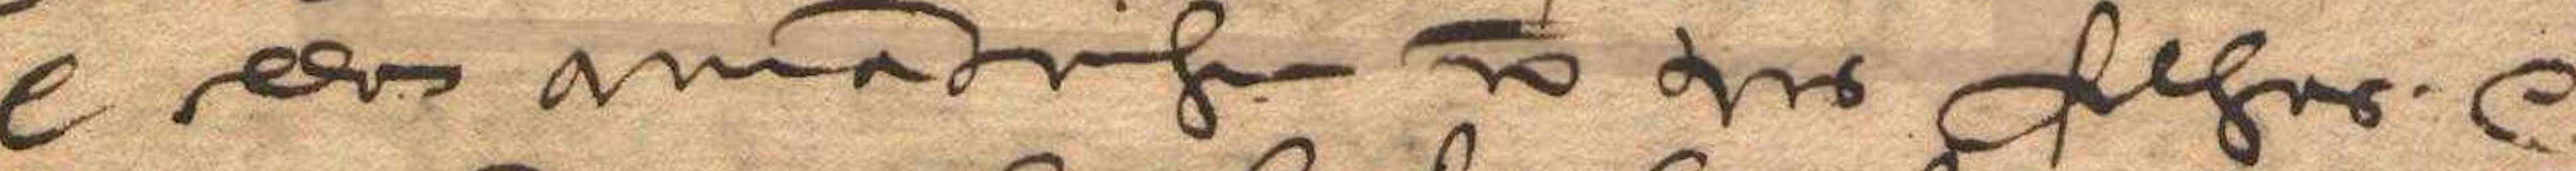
e elle a mātinha c̄o tres filhas. e
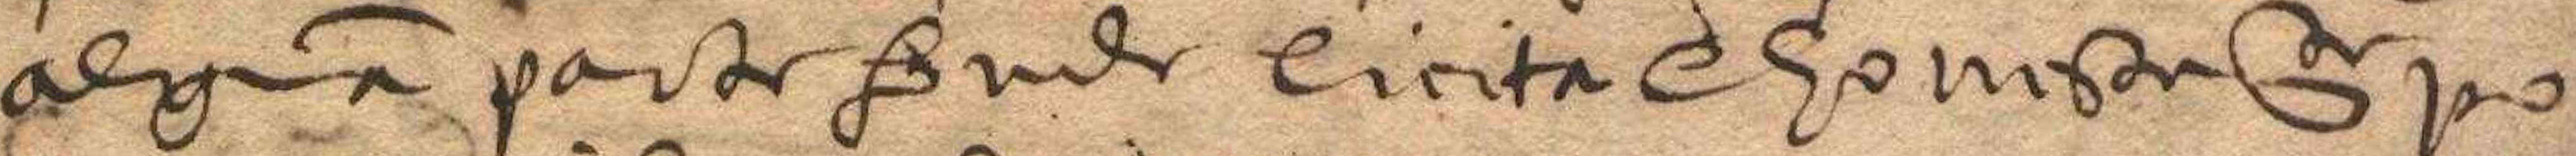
alguā parte honde licita e honestamte po
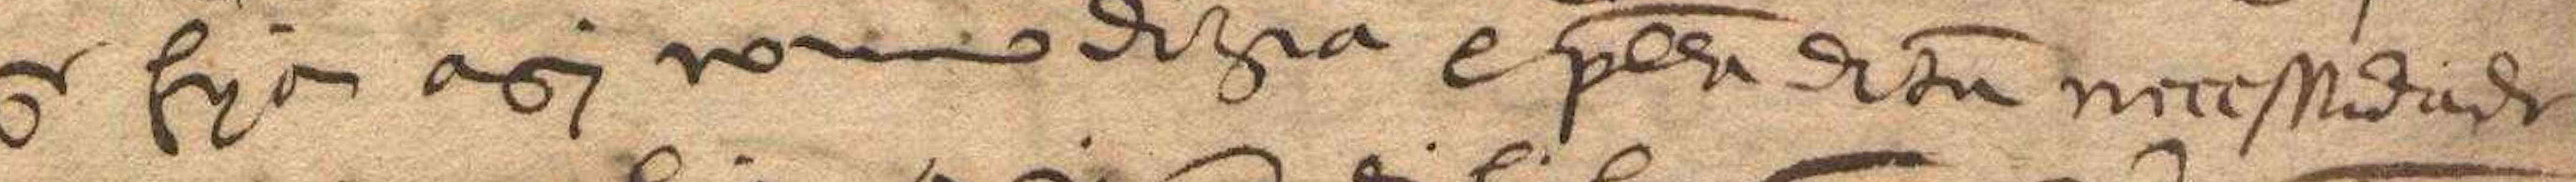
se hya asy como dizia e p̄lla dita necessidade
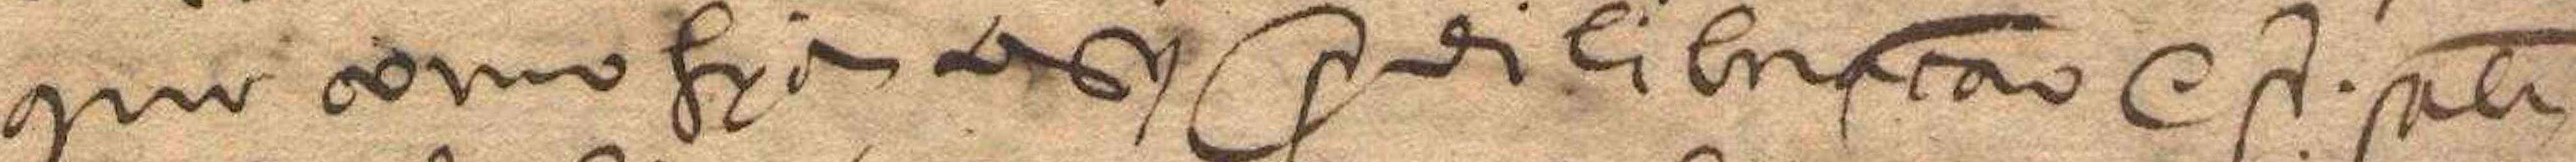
que como hya asy sē diliberação e sē. sābr
